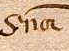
Sn̄or
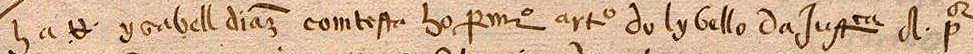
ha .R· ysabell diaz comtesta ho pmro arto do lybello da Justca A· por
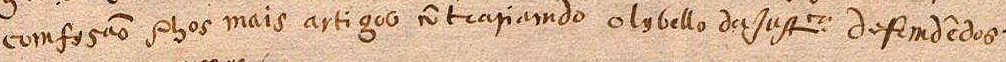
comfysão e hos mais artigos cōtrariamdo o lybello da Justca. defemdēdose
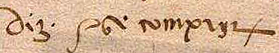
diz. e se compryr/
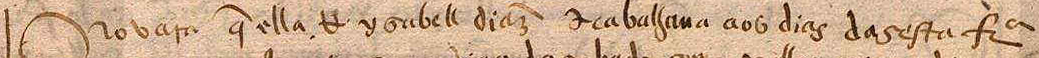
Provara q̄ ella .R· ysabell diaz trabalhaua aos dias da sesta fra
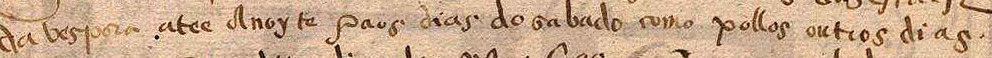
da vespora atee A noyte e aos dias do sabado como pollos outros dias
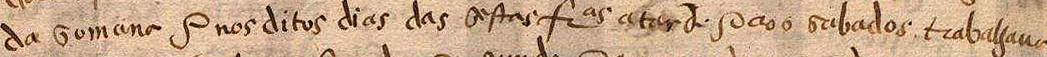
da somana e nos ditos dias das sestas fras a tarde e aos sabados trabalhaua
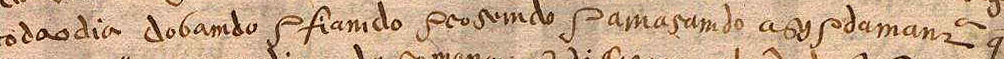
toda o dia dobamdo e fiamdo e cosemdo e amasamdo asy e da manra q̄
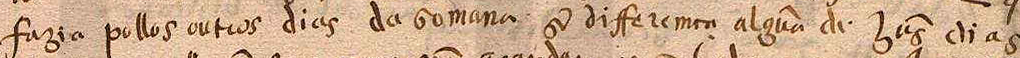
fazia pollos outros dias da somana sē differemça algūa de hūs dias
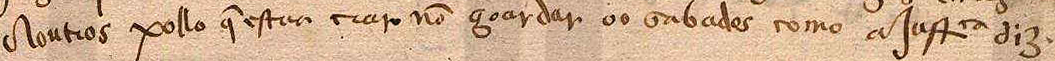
A outros pollo q̄ estaa craro nō goardar os sabados como a Justca diz.
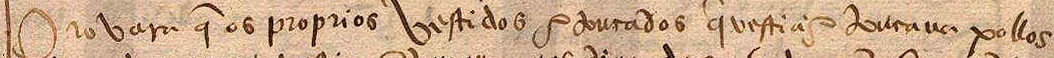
Provara q̄ os proprios Vestidos e toucados q̄ vestia e toucaua pollos
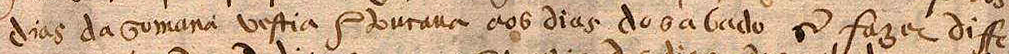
dias da somana vestia e toucaua aos dias do sabado sē fazer diffe
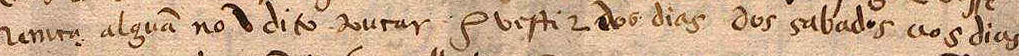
remça alguā no _ dito toucar e vestir dos dias dos sabados aos dias
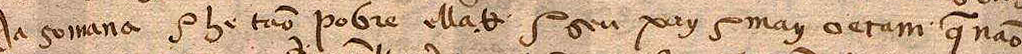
da somana e he tão pobre ella .R· e seu pay e may o eram q̄ não
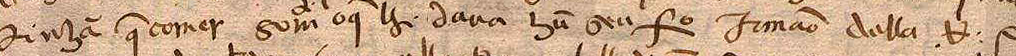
tinhā q̄ comer somte o q̄ lhe daua hū seu fo Jrmão della .R· e
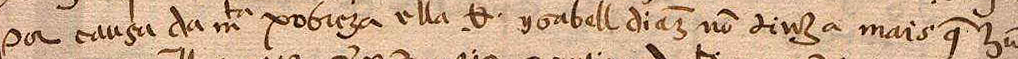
por causa da mta pobreza ella .R· ysabell diaz nō tinha mais q̄ hū
